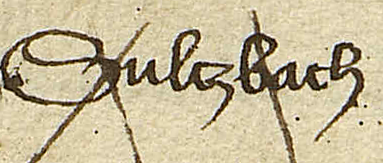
Sulcʒbach
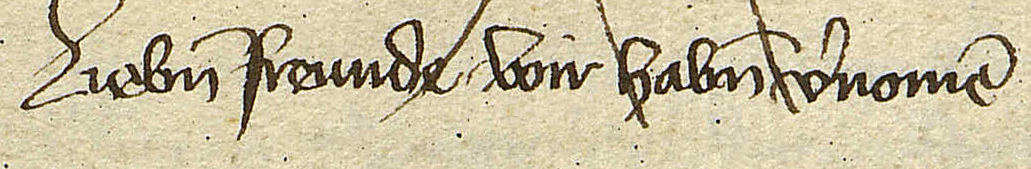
Liebn* freunde / wir habn* v*nome*
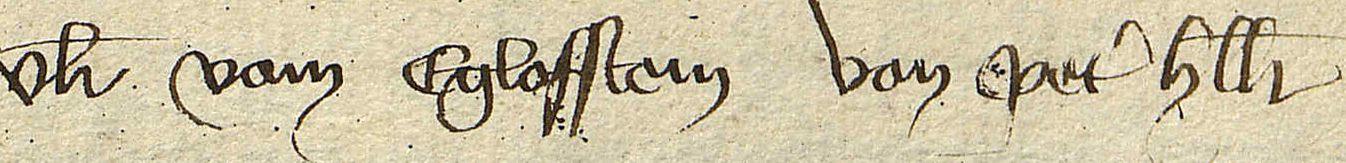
Vlr* von Eglofſtein von pet* hllr*
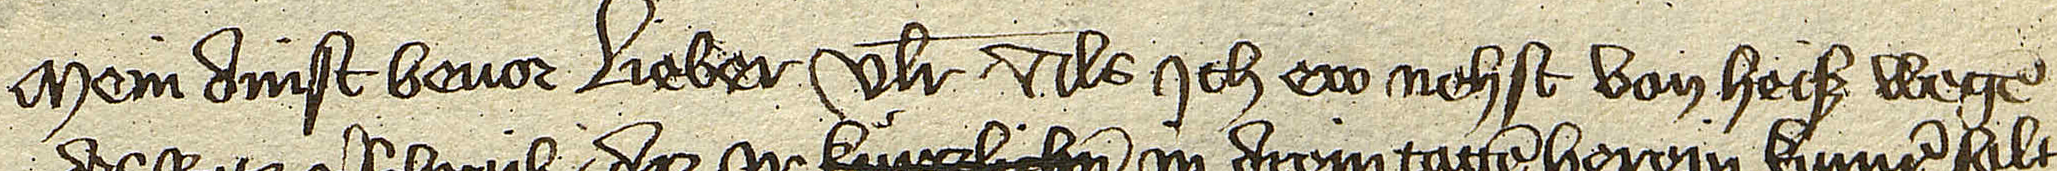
Mein dinſt beuor Lieber Vlr* / Als Ich ew nehſt von heiſʒ wege*
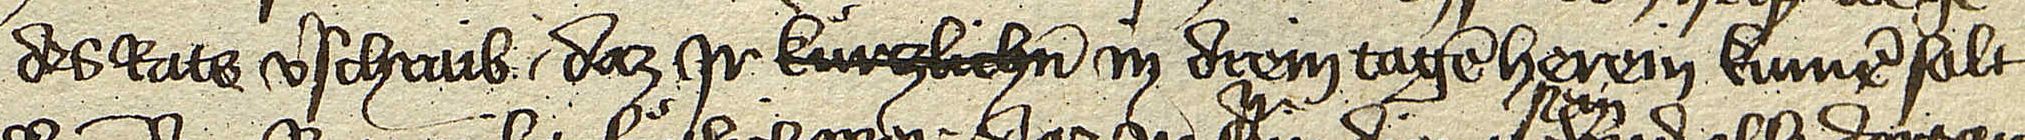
des Rats v*ſchraib / daʒ Ir kürcʒlichn* in drein tage* herein kume* ſolt
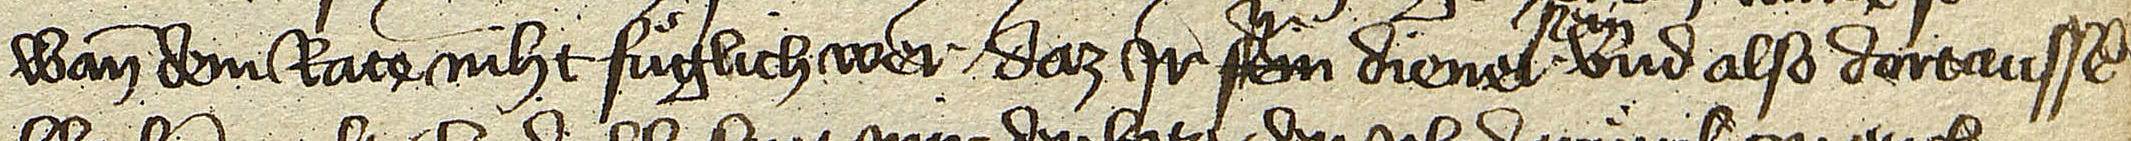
wan* dem Rate niht fürglich wer / daʒ Ir ſein diener vnd alſo dortauſſe*
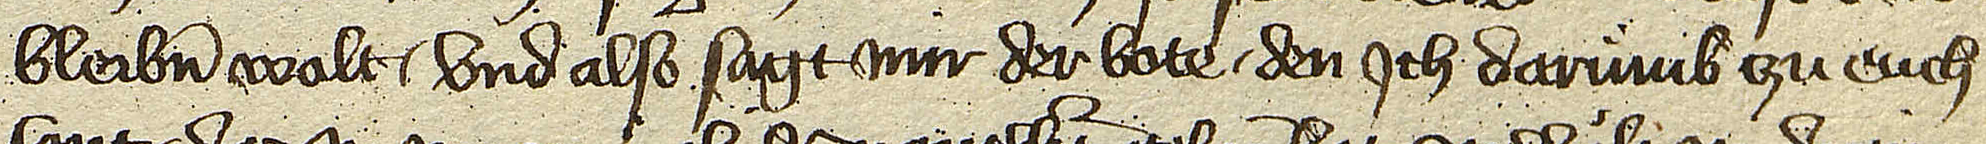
bleibn* wolt / vnd alſo ſagt mir der bote / den Ich darümb cʒu euch
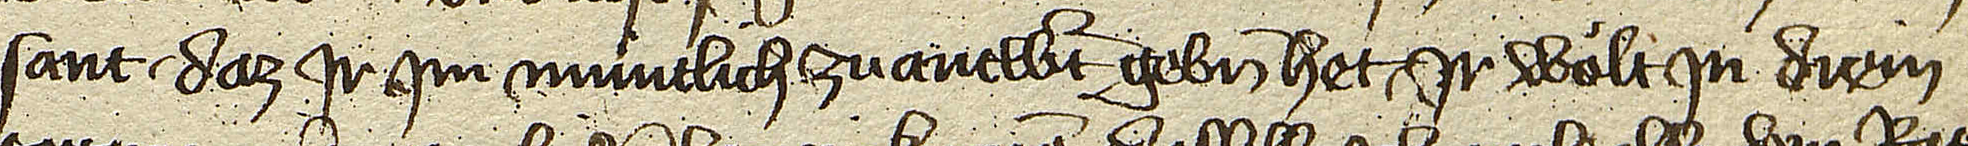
ſant / daʒ Ir Im müntlich cʒu antw*t gebn* het / Ir wölt In drein
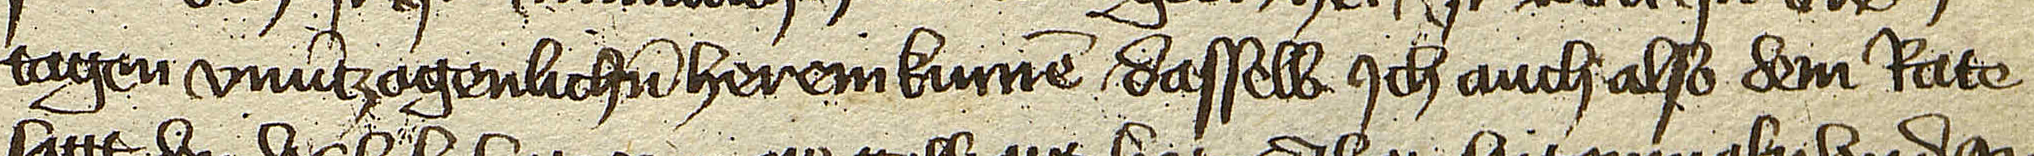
tagen vnu*cʒogenlichn* hereinkume* / daſſelb Ich auch alſo dem Rate
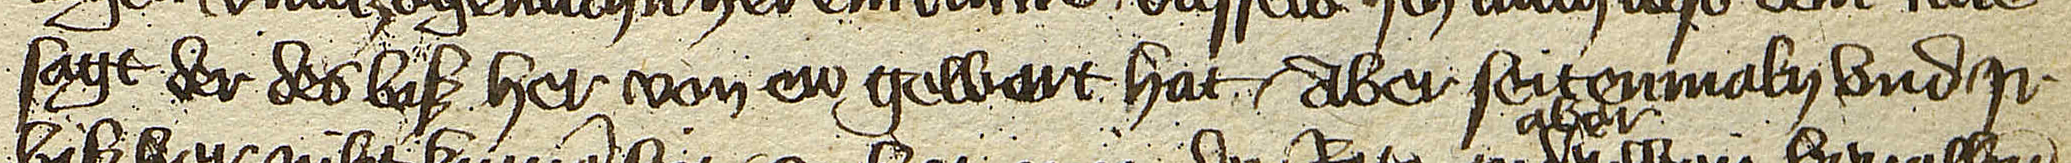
ſagt der des biſʒ her von ew gewart hat / Aber ſeitenmaln vnd Ir
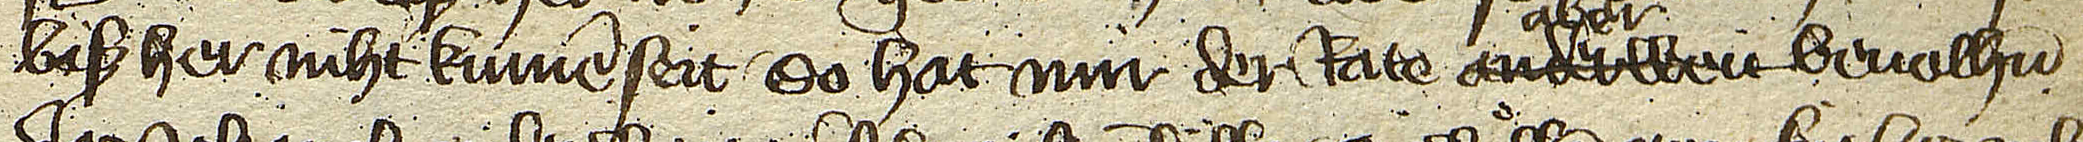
biſʒ her niht kume* ſeit / So hat mir der Rate anderweit beuolhn*
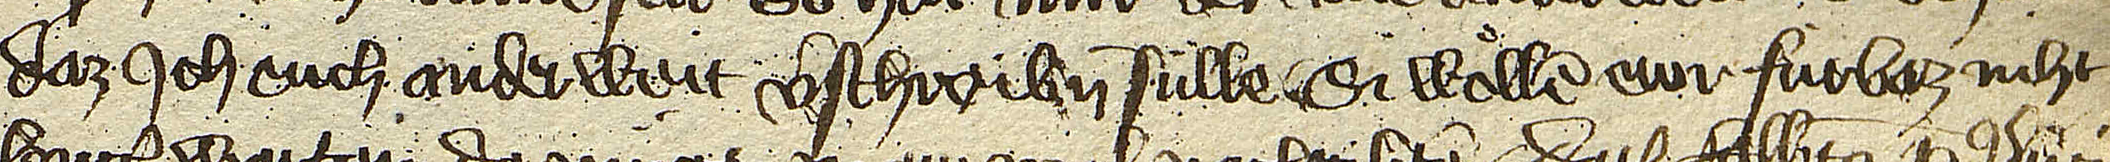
daʒ Ich euch anderweit v*ſchreibn* ſülle / So wölle ewr fürbaʒ niht
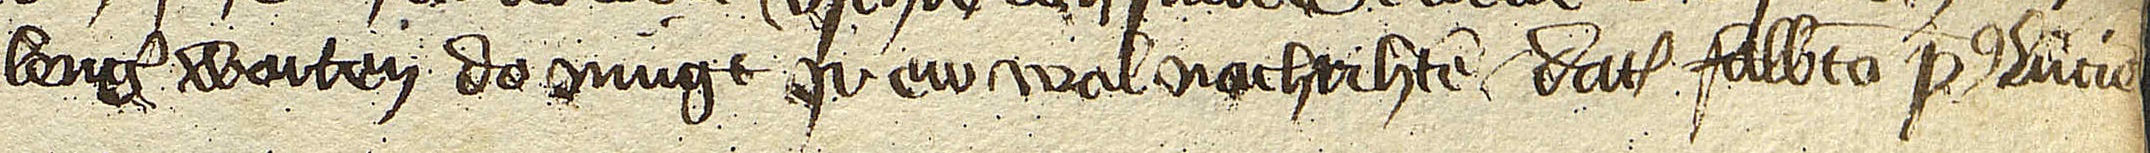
leng* warten do mügt Ir ew wol nachrichte* / dat* ſabbto* p* Lucie
